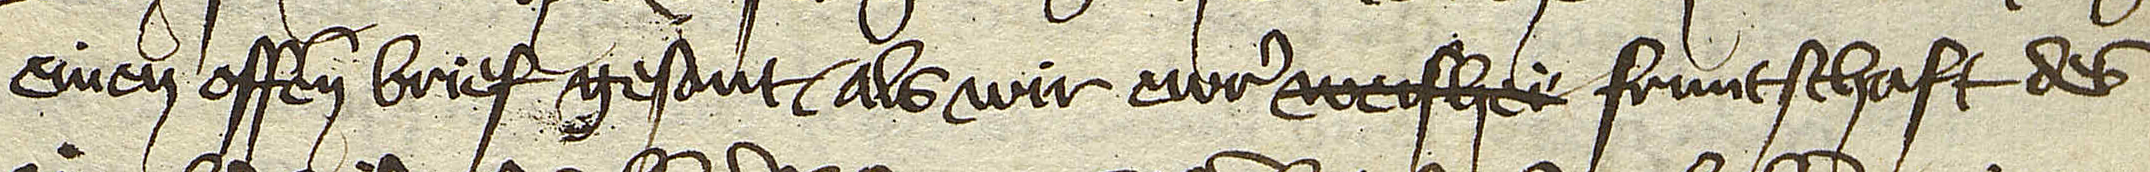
einen offen* brief geſant / als wir ewr weiſhei fruntſchaft des
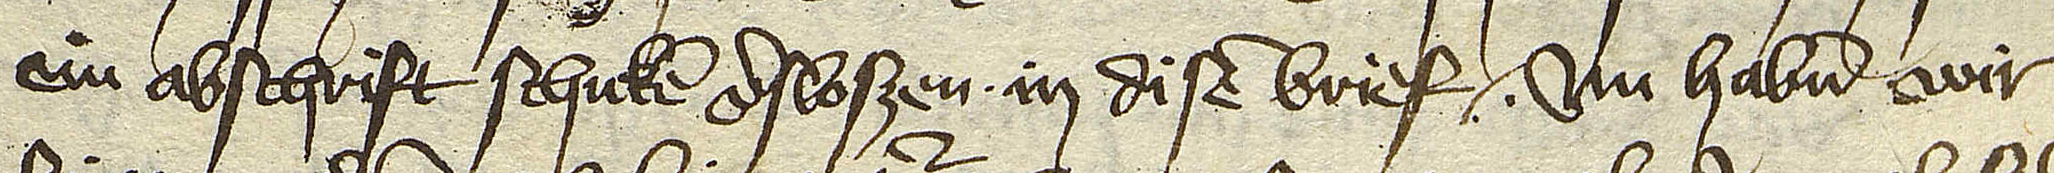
ein abſchrift ſchicke* v*ſloſʒen in diſe* brief / . Nu habn* wir
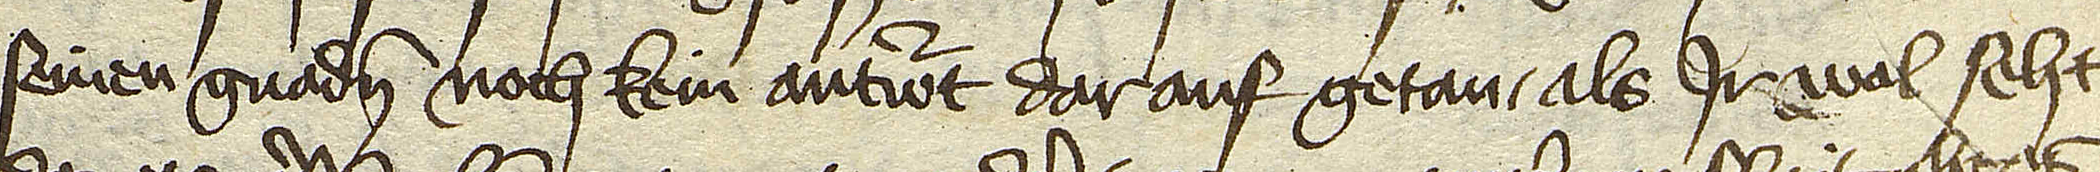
ſeinen gnadn* noch kein antwt* darauf getan / als Ir wol ſeht
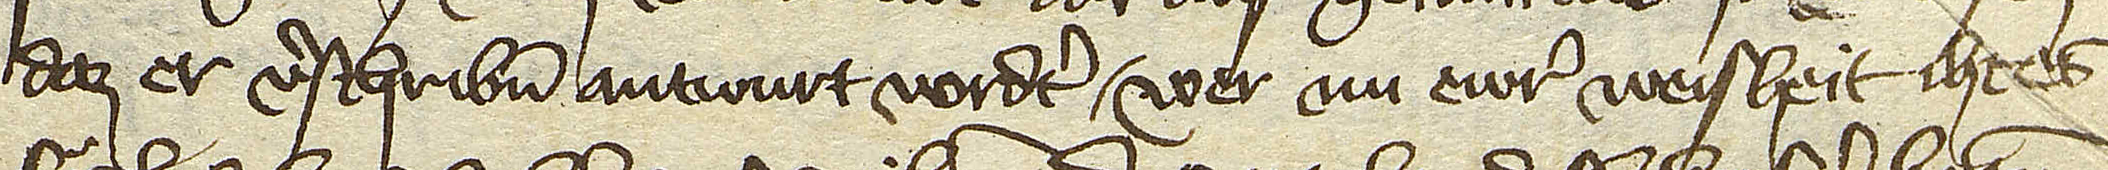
daʒ er v*ſchribn* antwurt vordt* / wer nu ewr* weiſheit ihtes
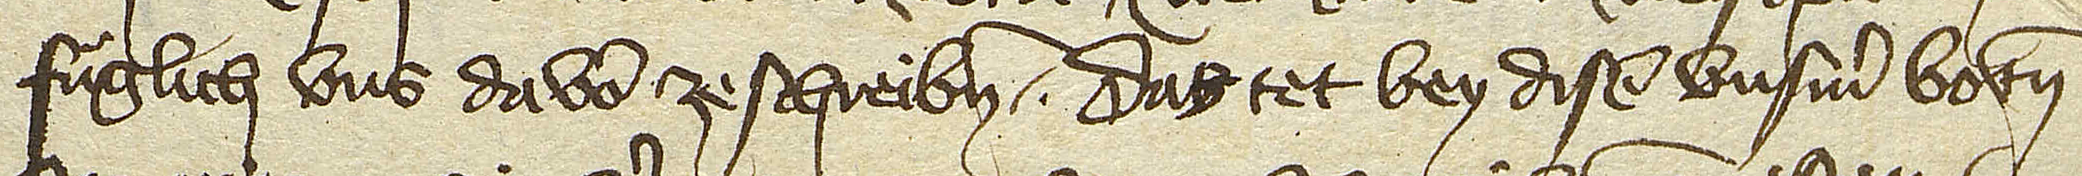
füglich vns davo* cʒe ſchreibn* / . Das tet bey diſe* vnſm* botn*
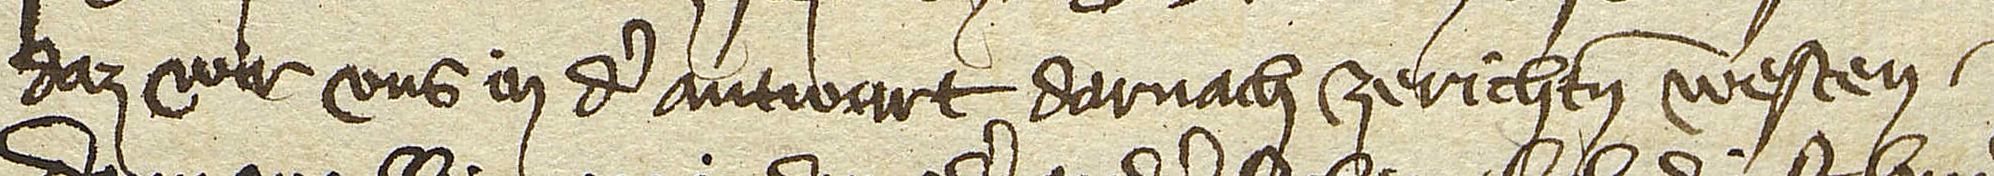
daʒ wir vns in d* antwurt darnach cʒerichtn* weſten /
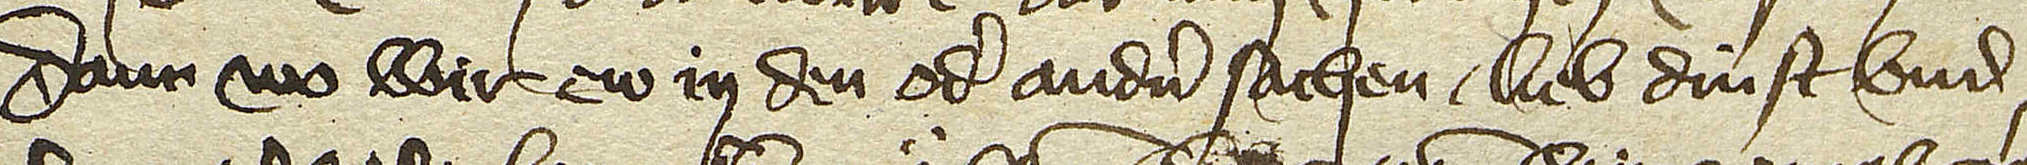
Dann wo wir ew in den od* andn* ſachen / lieb dinſt vnd
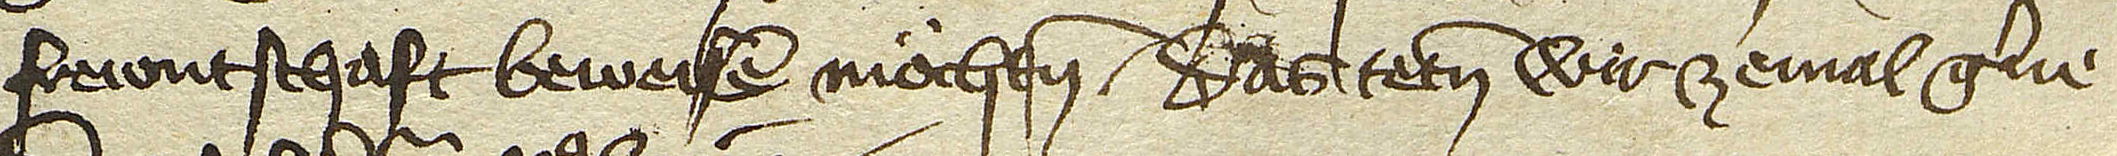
frewntſchaft beweiſe* möchtn* / Das tetn* wir cʒemal g*ne
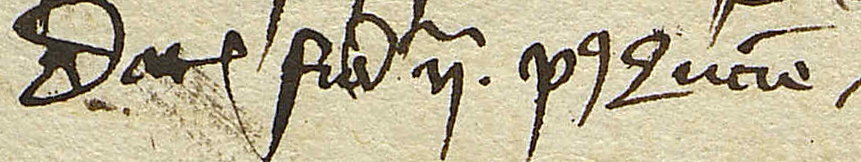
Dat* fia* ii* . p* Lucie /
